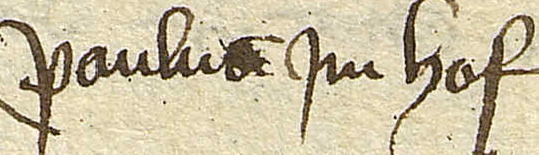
Paulus Im Hof
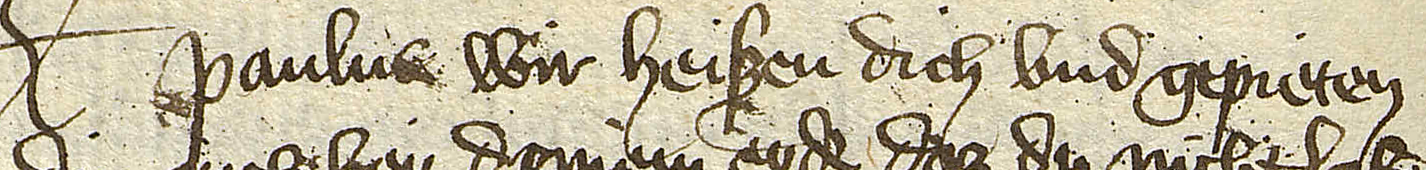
L* Paulus wir heiſʒen dich vnd gepieten
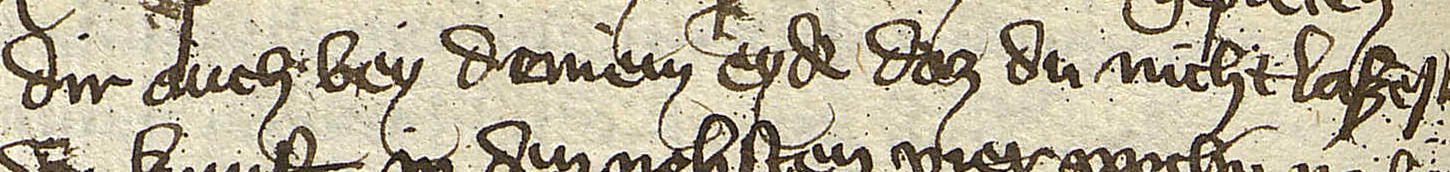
dir auch bey deinem eyde daʒ du nicht laſʒeſt
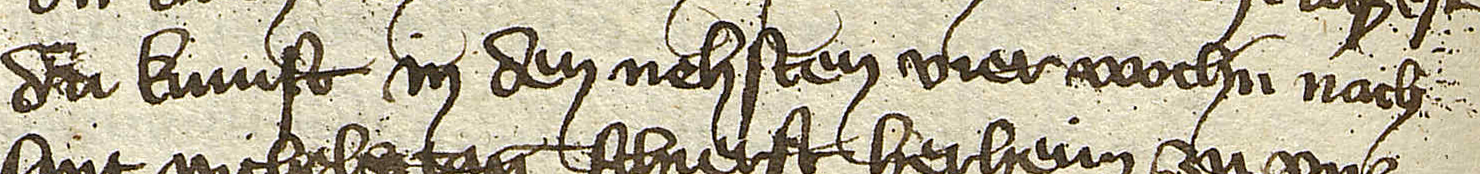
du kumſt in den nehſten vier wochn* nach
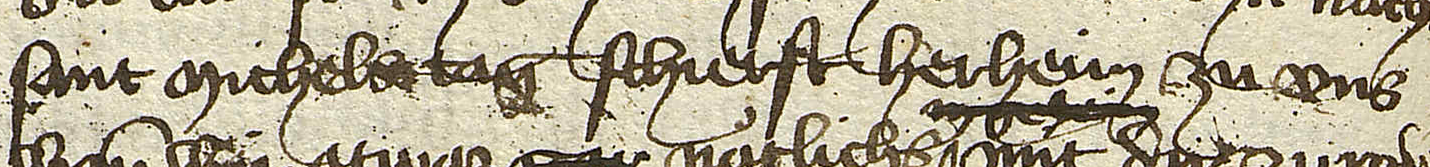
ſant Michelstag ſchierſt herheim cʒu vns
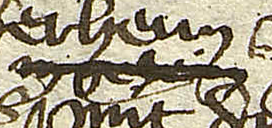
in geheim
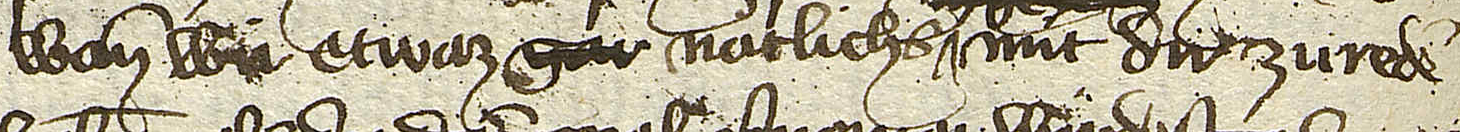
wan* wir etwaʒ gar nötlichs mit dir cʒu rede*
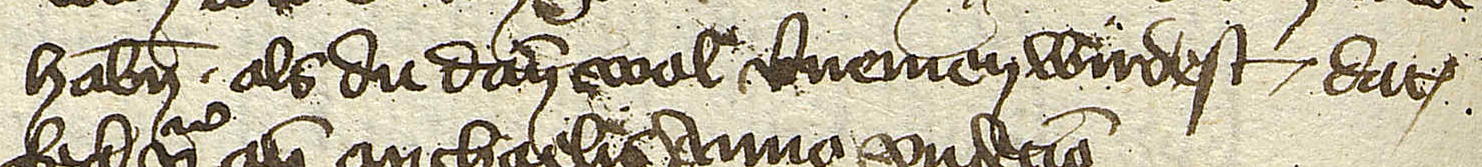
habn* / als du dan* wol v*nemen wirdeſt / dat*
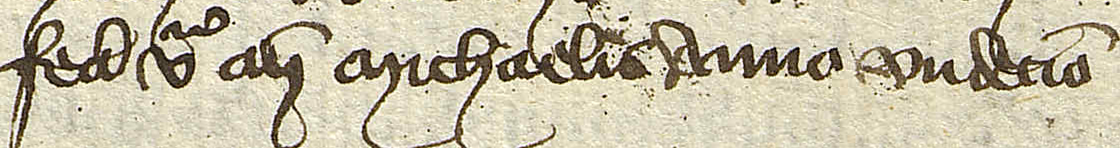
fea* v* an* Michaelis Anno vndecio*
